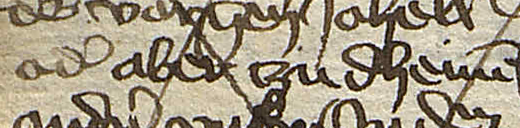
od* aber cʒu dheine*
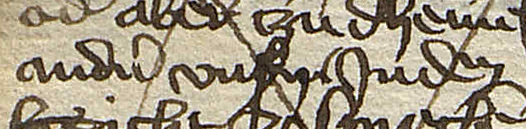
andn* vnſ*n Iuden
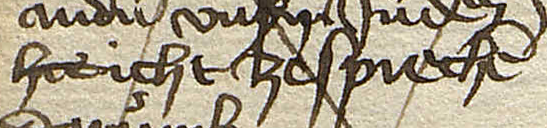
hie icht cʒeſpreche*
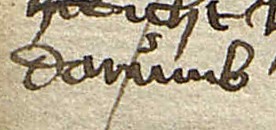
darümb
